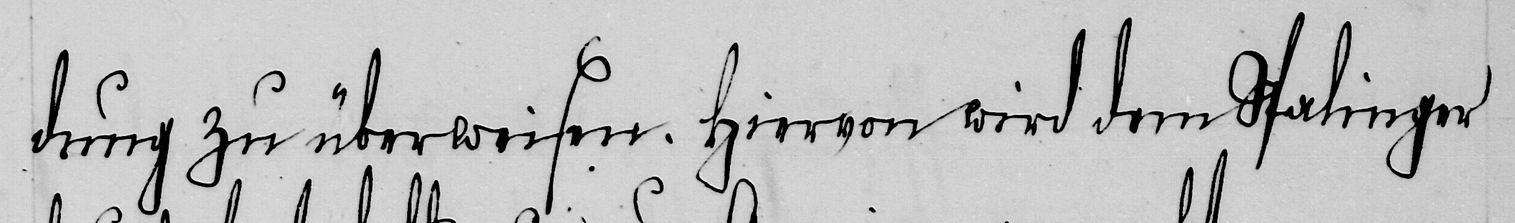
dung zu überweisen. Hiervon wird dem Spalinger
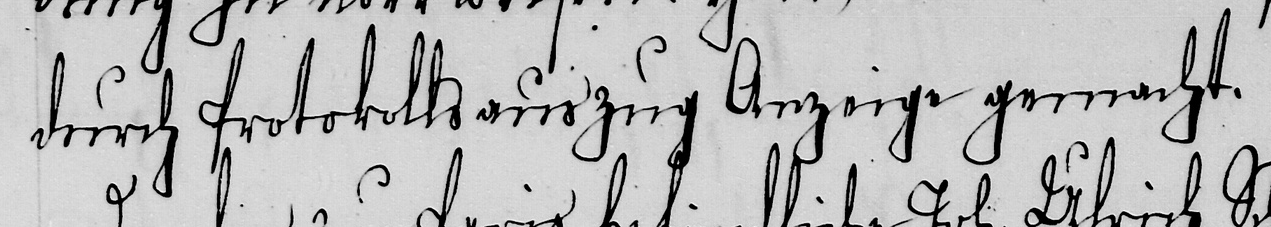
durch Protokollsauszug Anzeige gemacht.
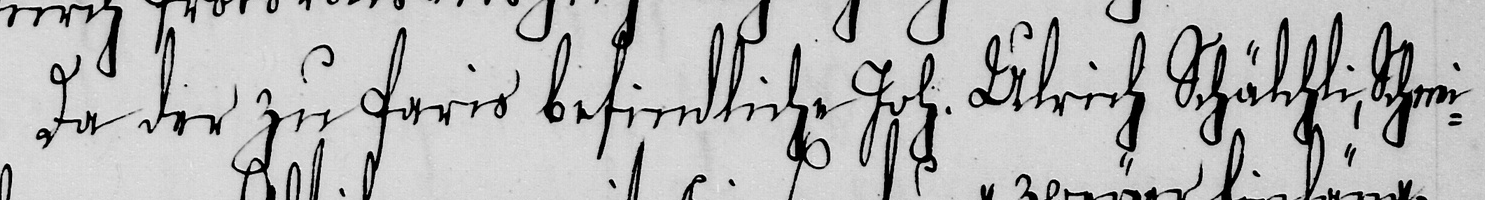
Da der zu Paris befindliche Joh. Ulrich Schälchli,
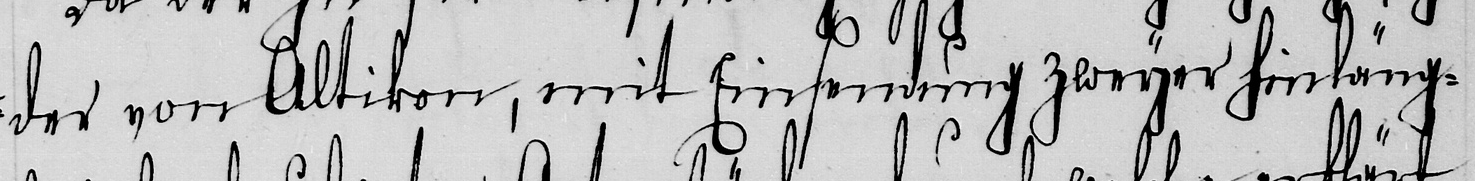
der von Altikon, mit Einsendung zweyer hinläng¬
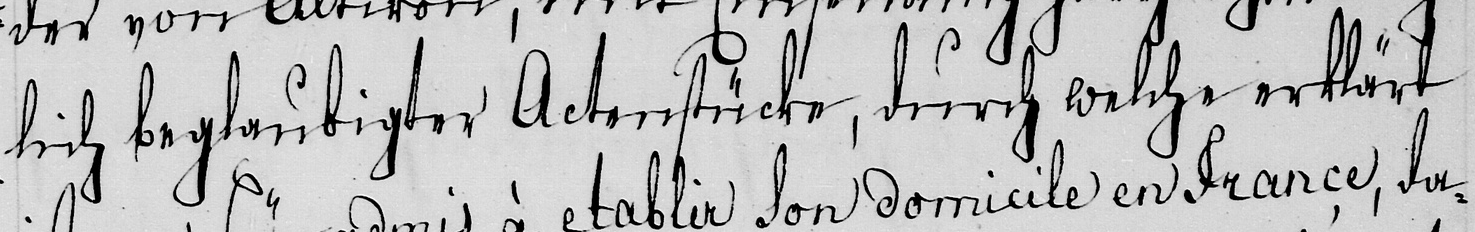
lich beglaubigter Actenstücke, durch welche erklärt
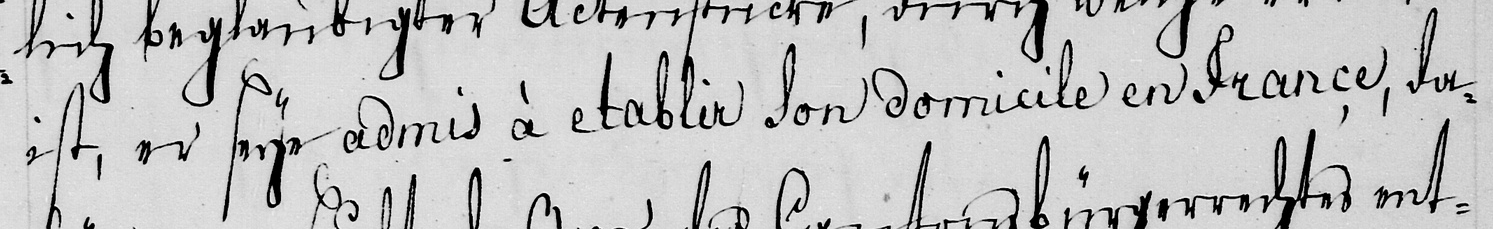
ist, er seye admis à etablir son domicile en France, da¬
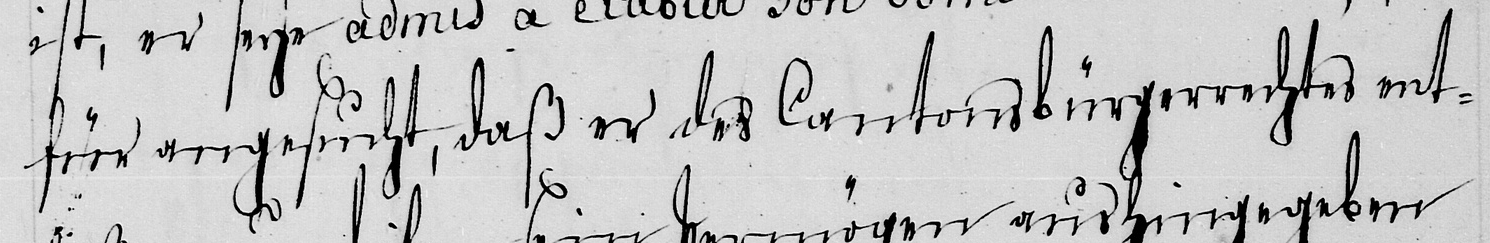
für angesucht, daß er des Cantonsbürgerrechtes ent¬
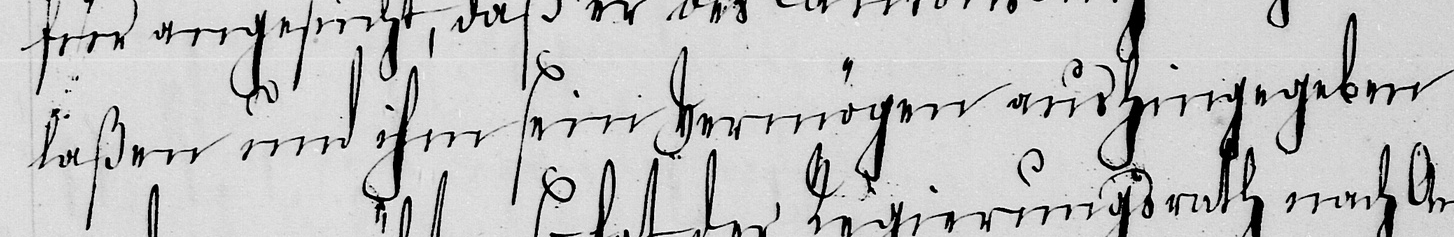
laßen und ihm sein Vermögen aushingegeben
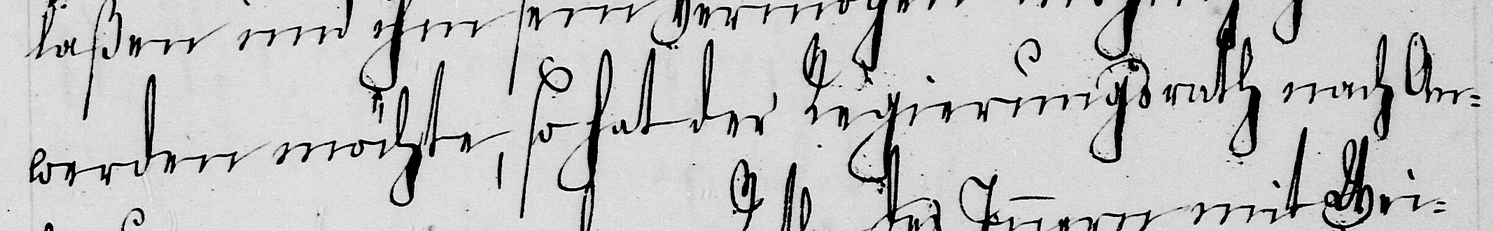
werden möchte, so hat der Regierungsrath nach An¬
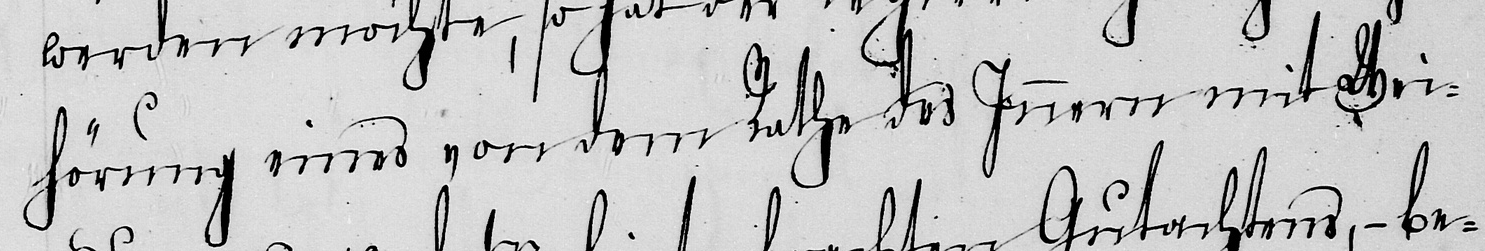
hörung eines von dem Rathe des Innern mit Wei¬
